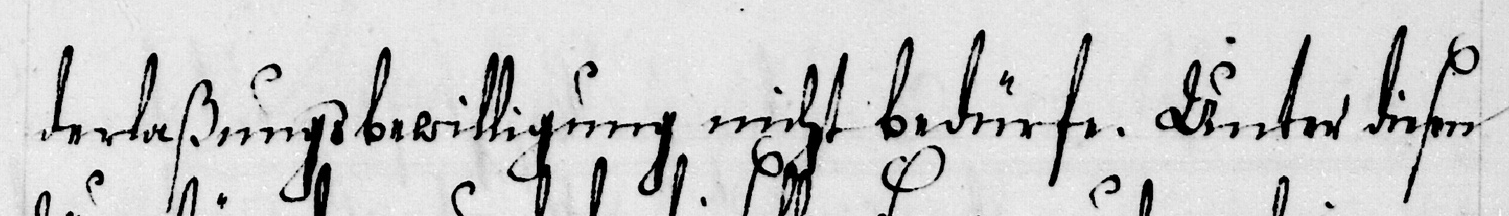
derlaßungsbewilligung nicht bedürfe. Unter diesen
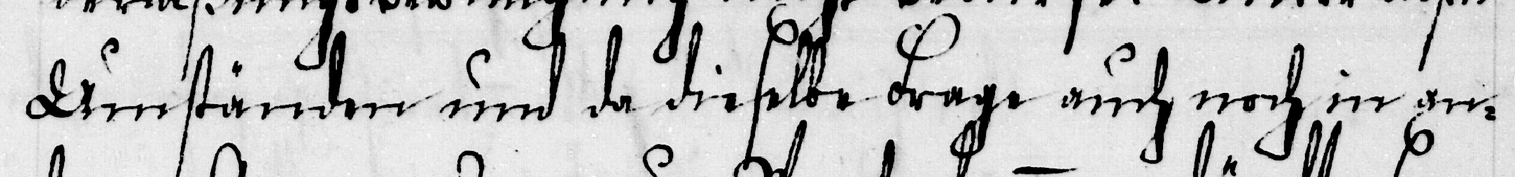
Umständen und da dieselbe Frage auch noch in an¬
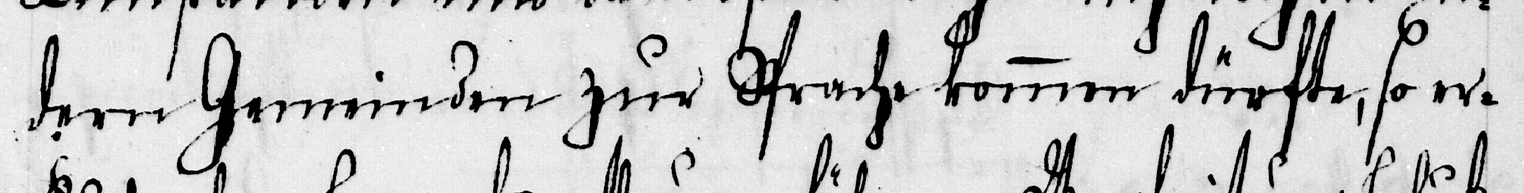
dern Gemeinden zur Sprache kommen dürfte, so er¬
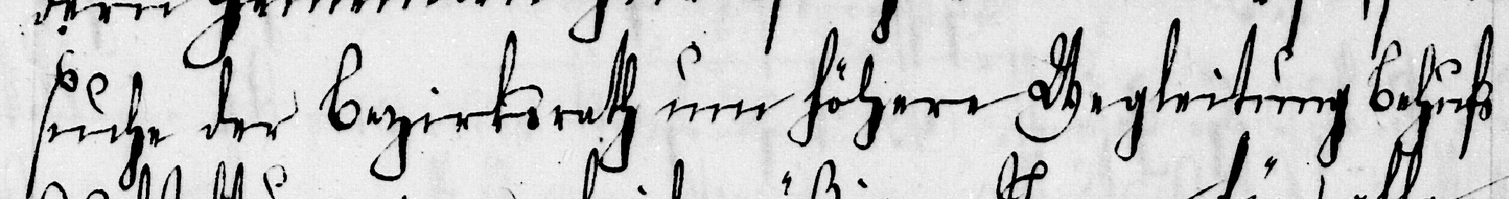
suche der Bezirksrath um höhere Wegleitung Behufs
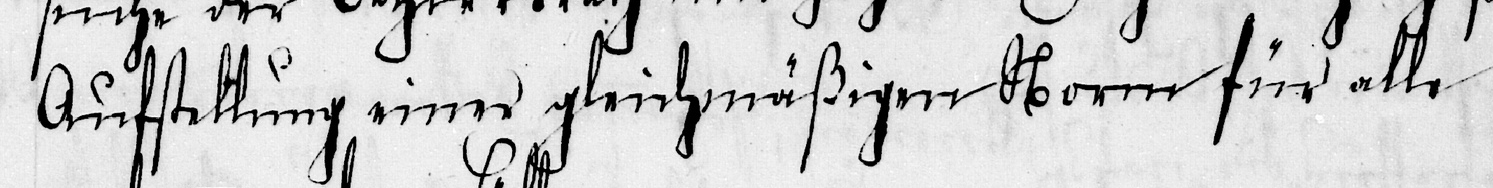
Aufstellung einer gleichmäßigen Norm für alle
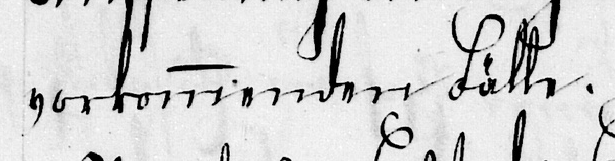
vorkommenden Fälle.
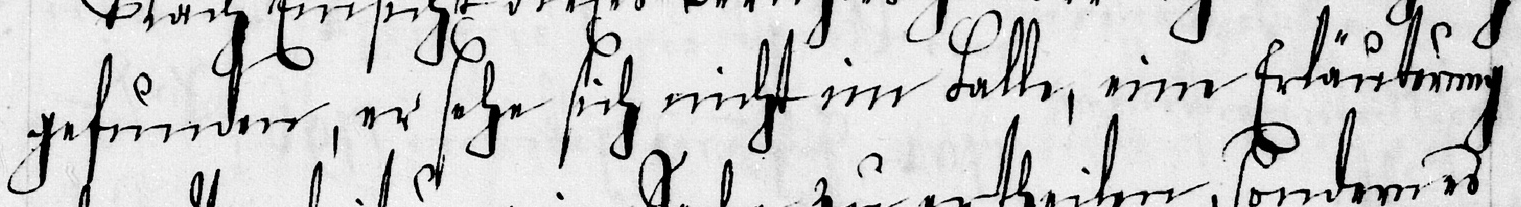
gefunden, er sehe sich nicht im Falle, eine Erläuterung
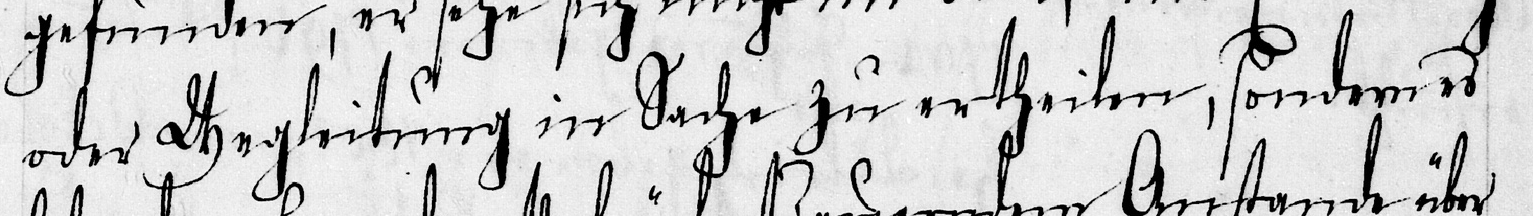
oder Wegleitung in Sache zu ertheilen, sondern es
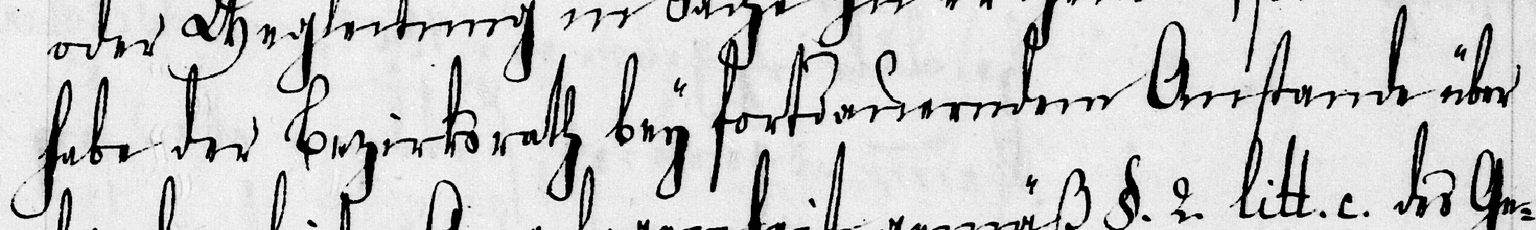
habe der Bezirksrath bey fortdauerndem Anstande über
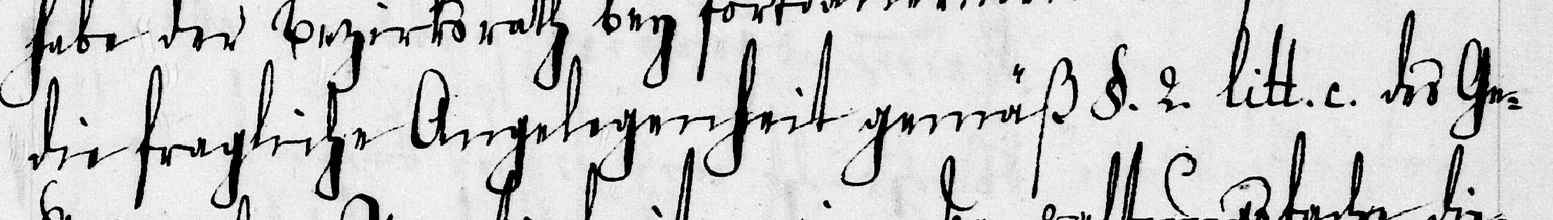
die fragliche Angelegenheit gemäß §. 2. litt. c. des
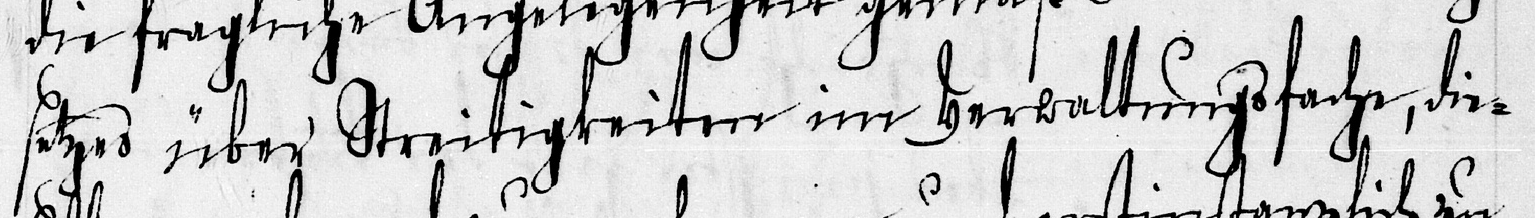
setzes über Streitigkeiten im Verwaltungsfache, die¬
